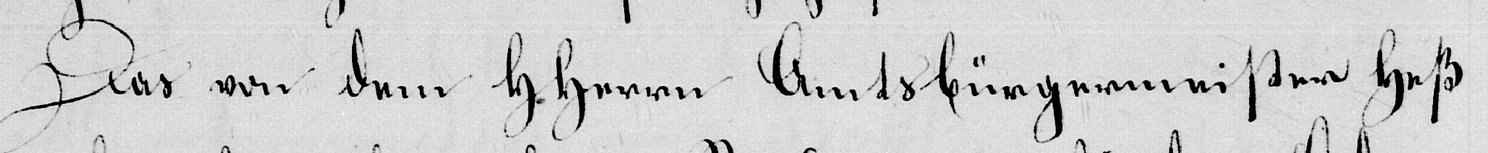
Das von dem HHerrn Amtsbürgermeister Heß
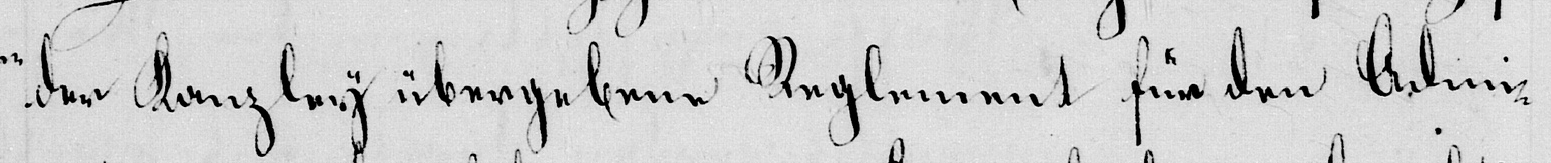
der Kanzley übergebene Reglement für den Admi¬
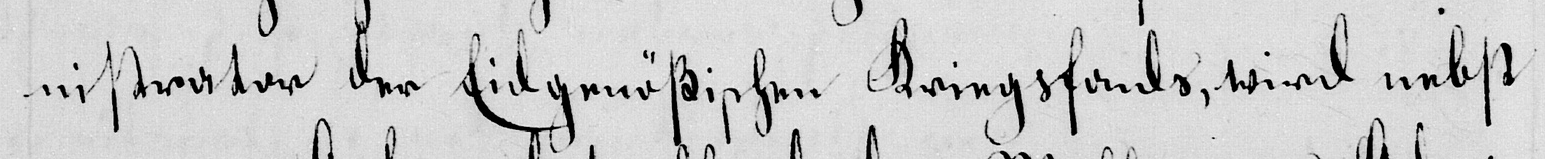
nistrator der Eidgenößischen Kriegsfonds, wird nebst
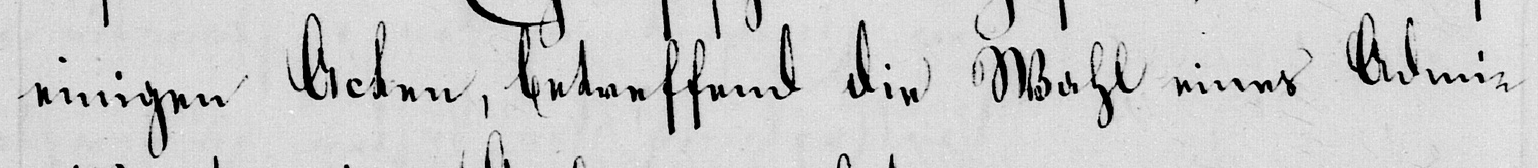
einigen Acten, betreffend die Wahl eines Admi¬
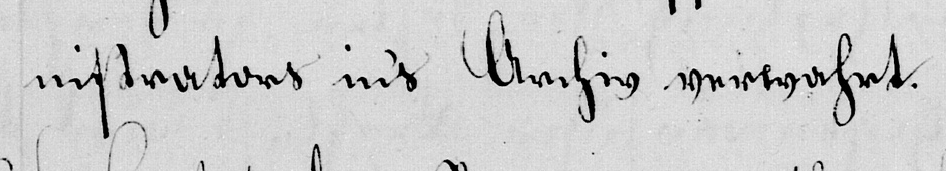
nistrators in‘s Archiv verwahrt.
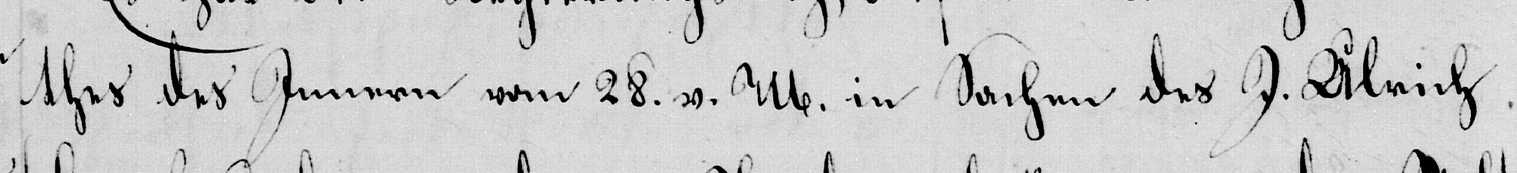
thes des Innern vom 28. v. M. in Sachen des J. Ulrich
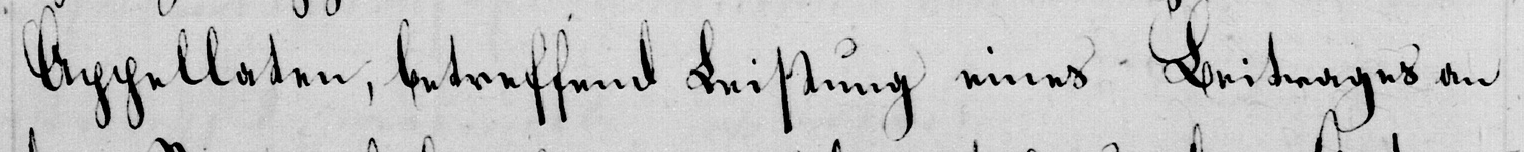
Appellaten, betreffend Leistung eines Beitrages an
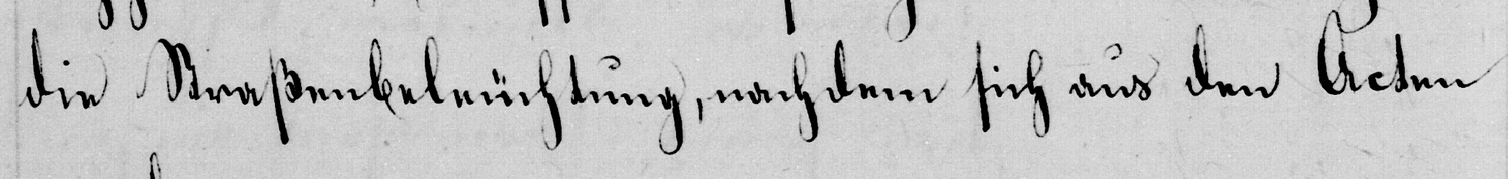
die Straßenbeleuchtung, nachdem sich aus den Acten
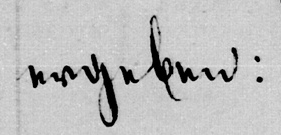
ergeben:
